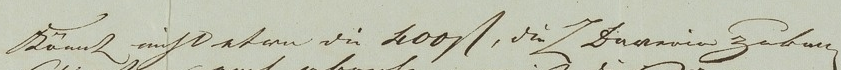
Könnten nicht etwa die 400 fl, die Herrn Daverio zukamen,
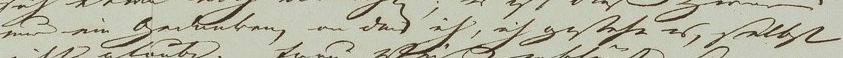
nur ein Gedanken, an den ich, ich gestehe es, selbst
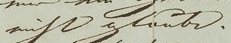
nicht glaube.
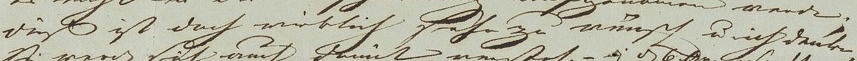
dieß ist doch wirklich sehr zu wünschen u ich denke,
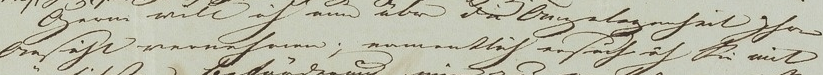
Ansicht vernehmen; namentlich ersuche ich Sie mit
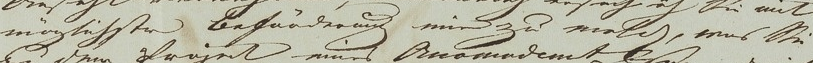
möglichster Beförderung mir zu melden, was Sie
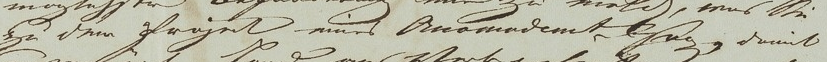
zu dem Project eines Accomodemt sagen, damit
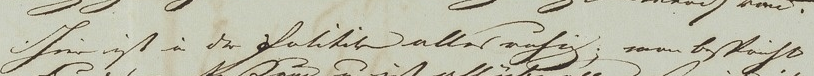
Hier ist in der Politik alles ruhig; man bespricht
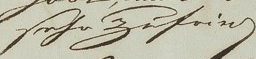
sehr zufrieden.
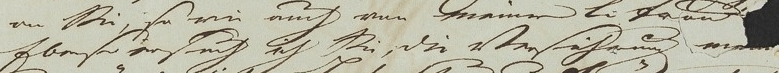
Ebenso ersuch ich Sie, die Versicherung meiner
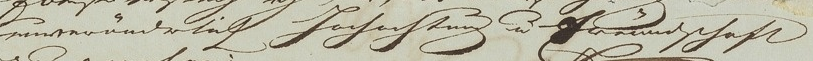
unveränderlichen Hochachtung u Freundschaft
